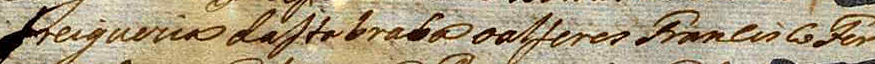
freiguezia da Jtabraba o alferes Francisco Fer
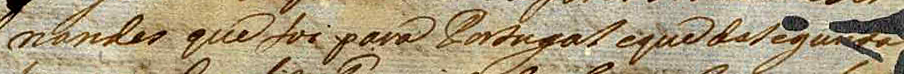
nandes que foi para Portugal e que da segunda
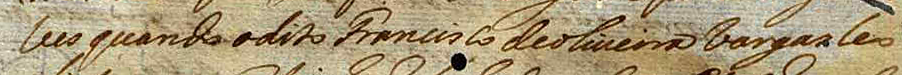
ves, quando o dito Francisco de oliueira Vargas leo
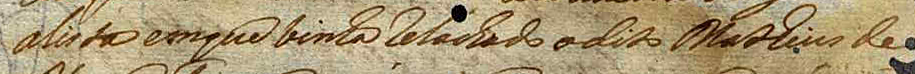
a lista em que vinha Relachado o dito Matheus de
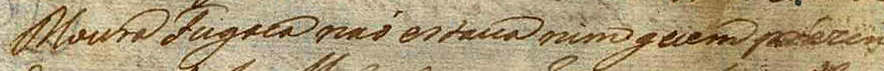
Moura Fugaça naõ estaua nimguem prezen
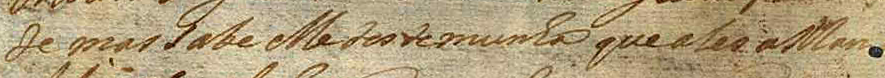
te mas sabe elle testemunha que o leo a Man
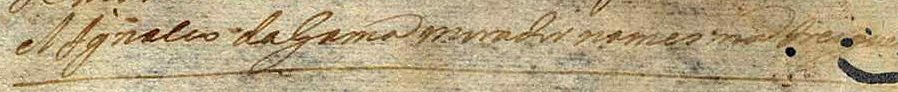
el Jgnacio da Gama morador na mesma freigue
